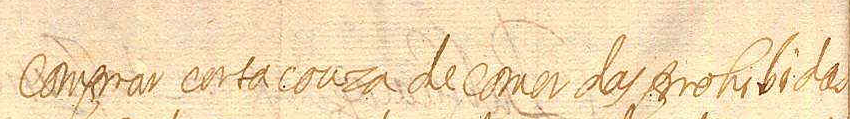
comprar certa couza de comer das prohibidas
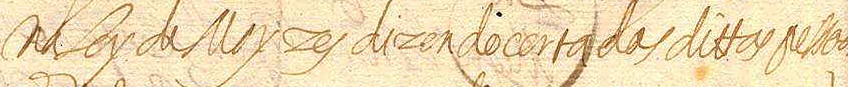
na Ley de Moyzes dizendo certa das dittas pessoa
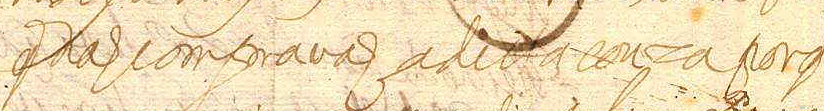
q̄ naõ compravaõ a ditta couza porq̄
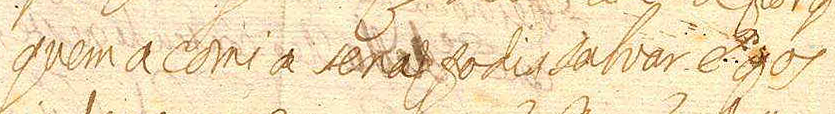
quem a comia se naõ podia salvar e q̄ os
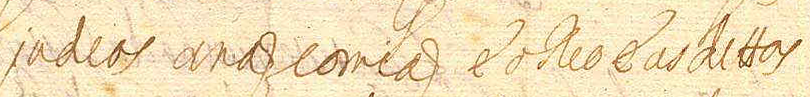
judeos a naõ comiaõ e o Reo e as dittas
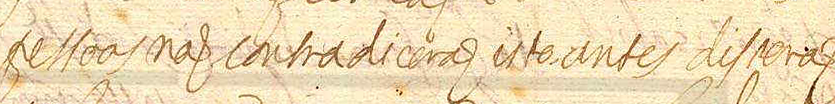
pessoas naõ contradiceraõ isto antes disseraõ
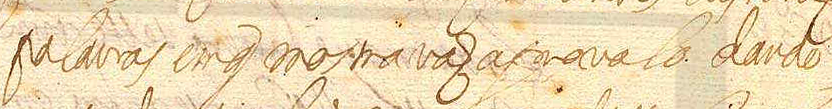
palauras em q̄ mostravaõ aprovalo dando
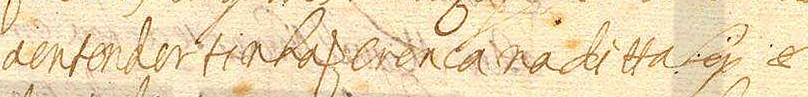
a entender tinhaõ crença na ditta ley e
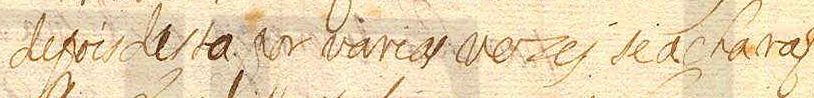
depois desta por varias vezes se acharaõ
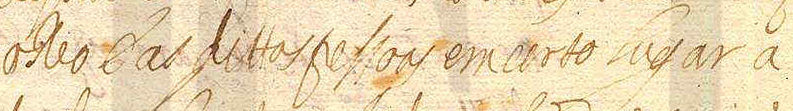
o Reo e as dittas pessoas em certo lugar a
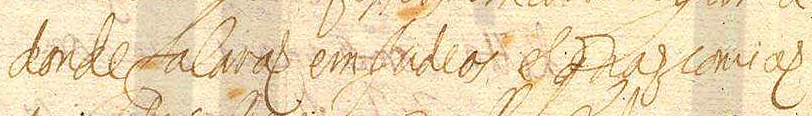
donde falavaõ em Judeos e q̄ naõ comiaõ
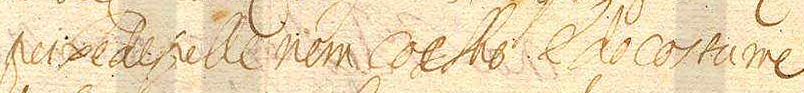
peixe de pelle nem coelho e do costume
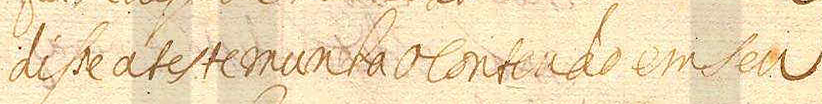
disse a testemunha o conteudo em seu
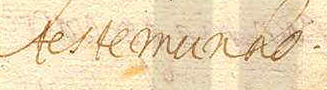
testemunho.
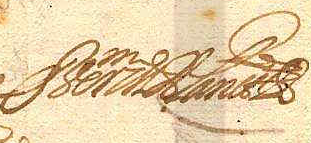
Berthmo de Lanctre
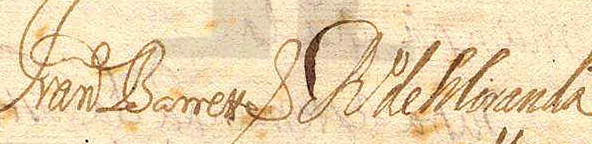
Fran.co Barretto Ro de Miranda
